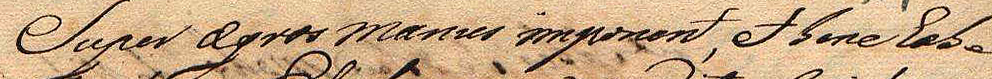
Super ægros manus imponent, et̄ bene habe
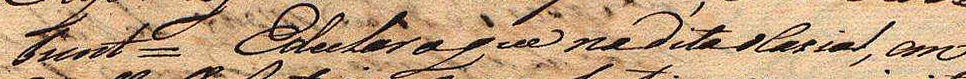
bunt= E declara que na dita oCaziaõ, em
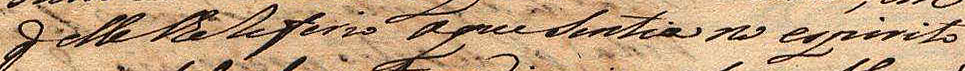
q̄ elle lhe Referio o que sentia no espirito
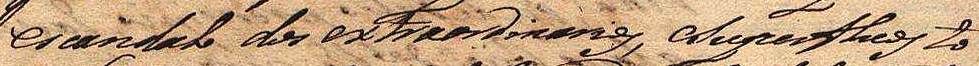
escandalo dos extraordinarios, e superfluos to
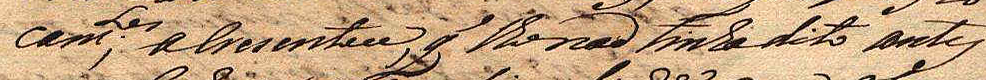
cam.tes; acresentece, q̄ lhe naõ tinha dito antes
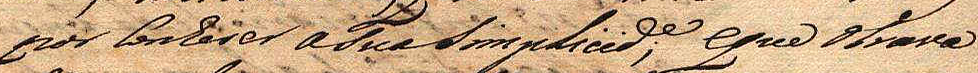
por Conheser a Sua simplicid;e e que obrava
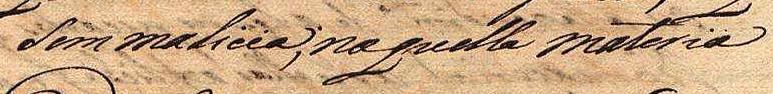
sem malicia, naquella materia
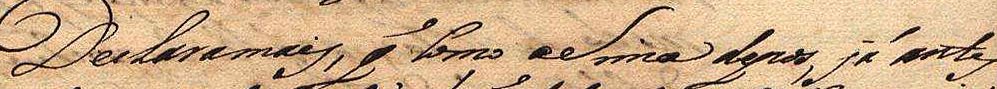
Declara mais, q̄ Como aSima depos, já antes
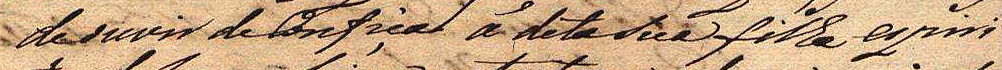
de ouvir de conficaõ á dita sua filha espiri
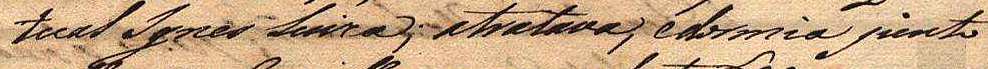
tual Ignes Luiza; a tratava, e dormia junto
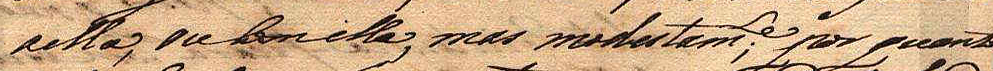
a ella, ou Com ella, mas modestam.te porquanto
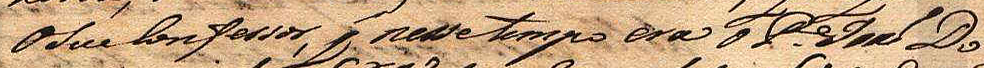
o seu Confessor q̄ nesse tempo era o P.e Ioaõ Do
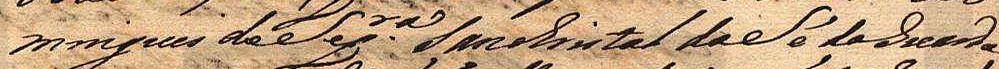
mingues de Seq.ra Sanchristaõ da Sé da Guarda,
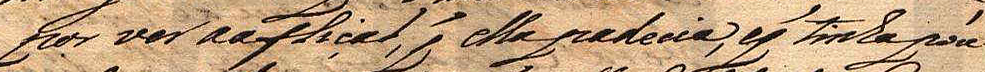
por ver a afliçaõ, q̄ ella padecia, e q̄ tinha pou
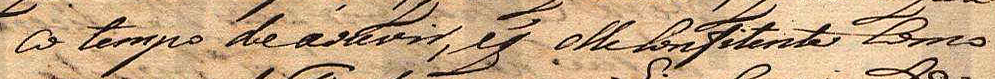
co tempo de a ouvir, e q̄ elle Confitente Como
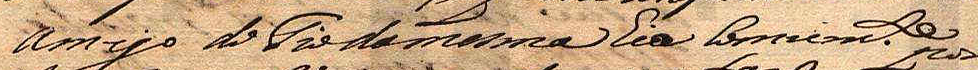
amigo do Tio da mesma hia comum.te por
